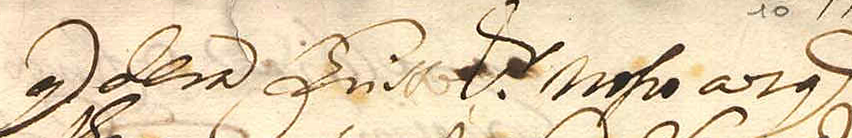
q̄ dera Christo s.or nosso aos q̄
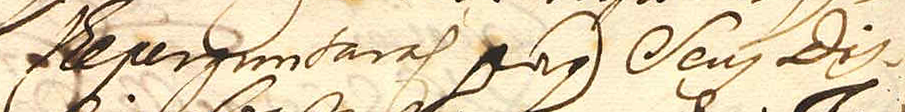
lhe perguntaraõ porq̄ seus Dis
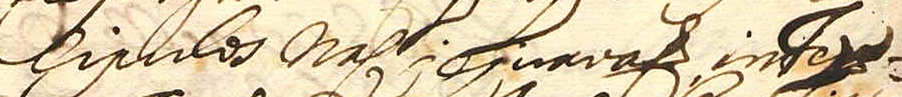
cipulos naõ iejuavaõ, inter
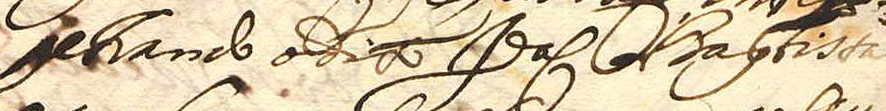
petrando o dito Joaõ Baptista
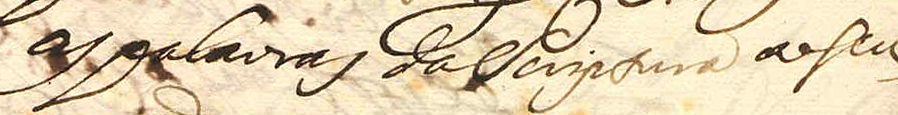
as palavras da Scriptura ao seu
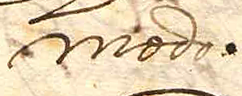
modo.
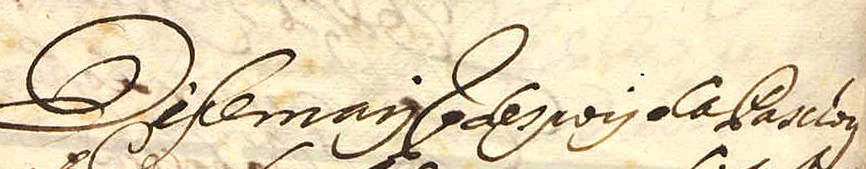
Disse mais q̄ despois da Paschoa
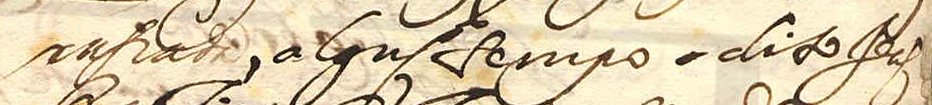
passada, algū tempo o dito Joaõ
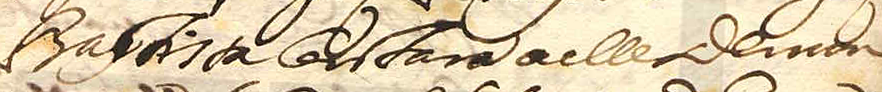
Baptista Constara a elle Denun
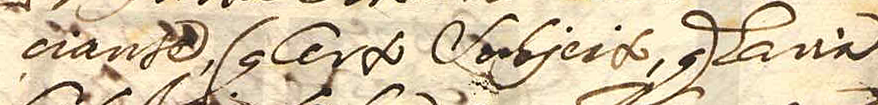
ciante, q̄ Certo Sobjeito, q̄ hauia
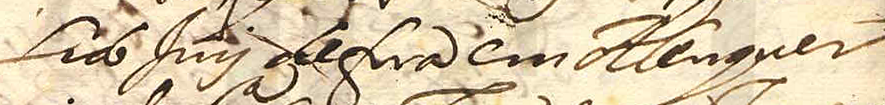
sido Juis de fora em Alenquer
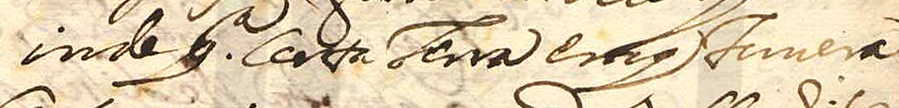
indo p.a certa terra em q̄ temera
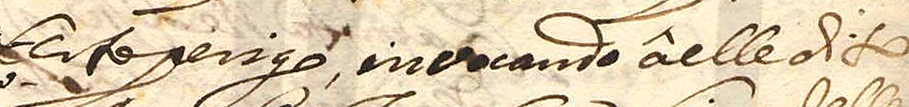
certo perigo, invocando á elle dito
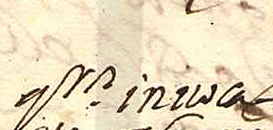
qrs. inuoca
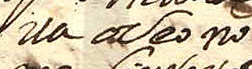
ua o seo no
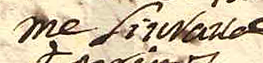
me liuraua
